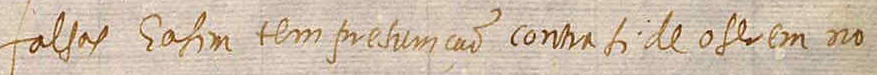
falsas E asim tem presumçaõ contra si de o serem no
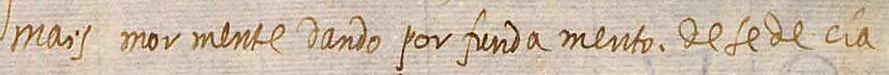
mais mormente dando por fundamento de se decla
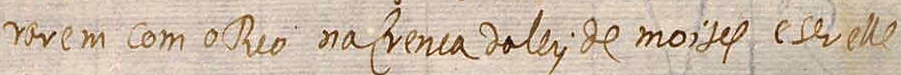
rarem com o Reo na Crenca da ley de moises e ser elle
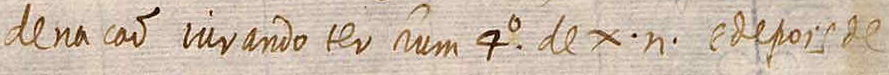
de nacaõ iurando ter hum 4º. de x. n. e depois de
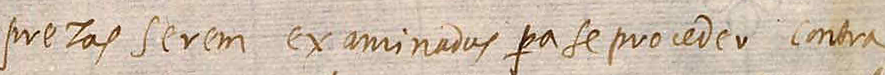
prezas serem examinadas ꝑa se proceder contra
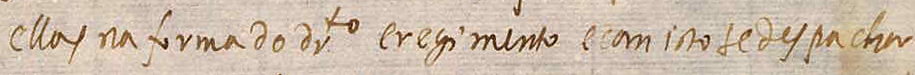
ellas na forma do drto e regimento e com isto se despachar
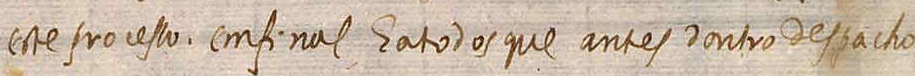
este processo em final E a todos que antes doutro despacho
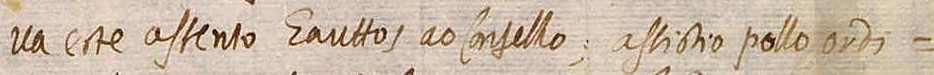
ua este assento E auttos ao Conselho; assistio pollo ordi
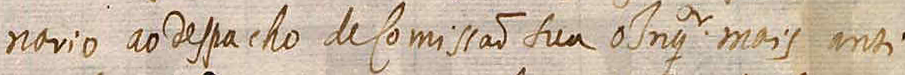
nario ao despacho de Comissaõ sua o Inqor. mais anti
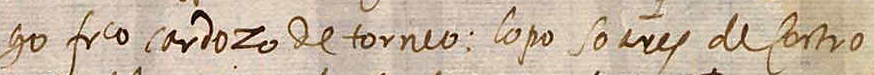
go frco cardozo de torneo: lopo Soares de Castro
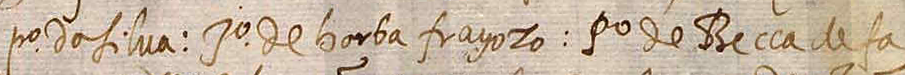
po. da Silua: Po. de borba fragozo: Po de Becca de fa
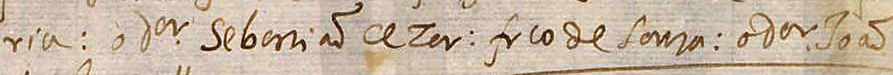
ria: o dor. Sebastiaõ cezar: frco de souza: o dor. Ioão
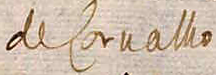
de Carualho
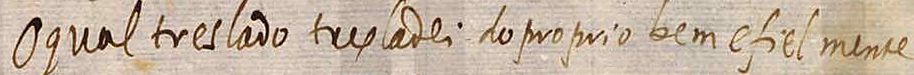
O qual treslado tresladei do proprio bem e fielmente
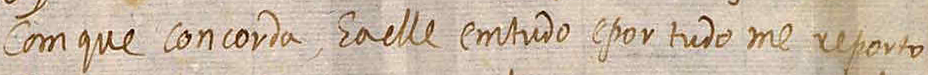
com que concorda, E a elle em tudo e por tudo me reporto
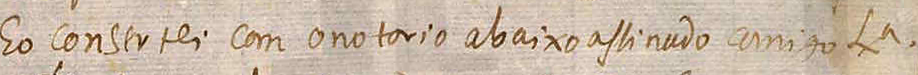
E o consertei com o notario abaixo assinado comigo Lxa.
